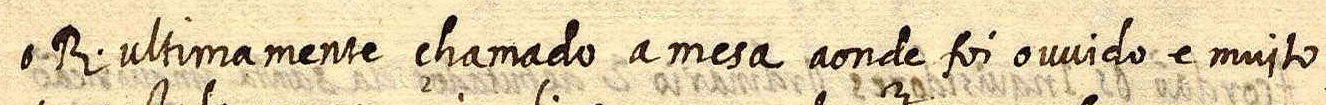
o R. ultimamente chamado a mesa aonde foi ouuido e mujto
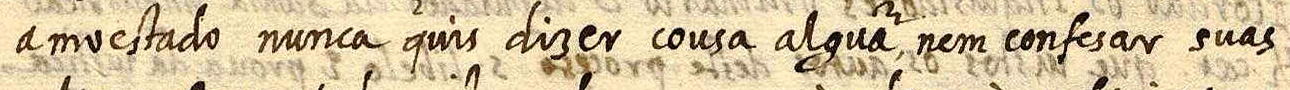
amoestado nunca quis dizer cousa alguā, nem confesar suas
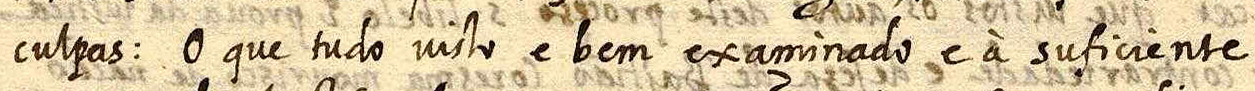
culpas: O que tudo uisto e bem examinado e a suficiente
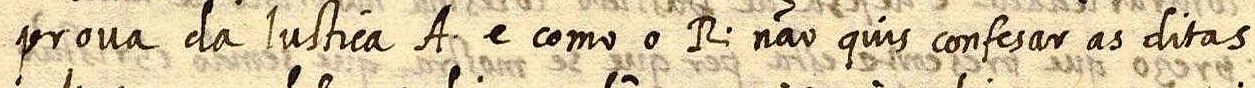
proua da Iustiça A. e como o R. não quis confesar as ditas
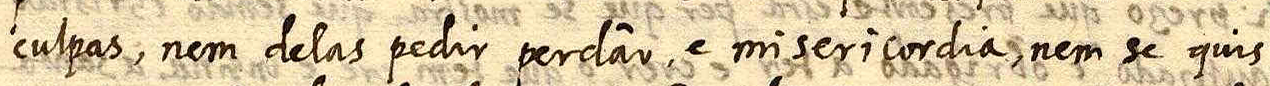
culpas, nem delas pedir perdão, e misericordia, nem se quis
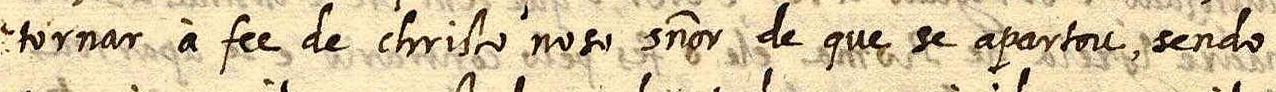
tornar à fee de christo noso sn̄or de que se apartou, sendo
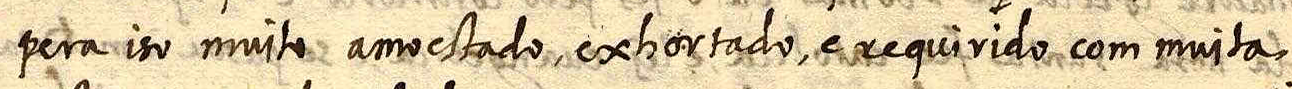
pera iso muito amoestado, exhortado, e requirido com muita
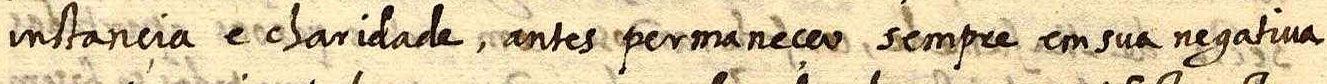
instançia e charidade, antes permaneçeo sempre em sua negatiua
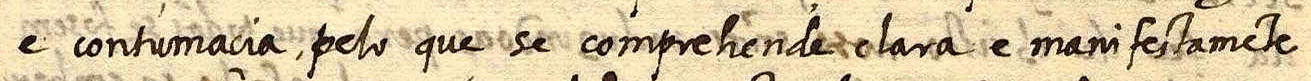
e contumacia, pelo que se comprehende clara e manifestamēte
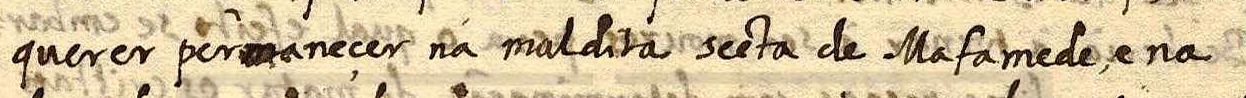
querer permaneçer na maldita secta de Mafamede, e na
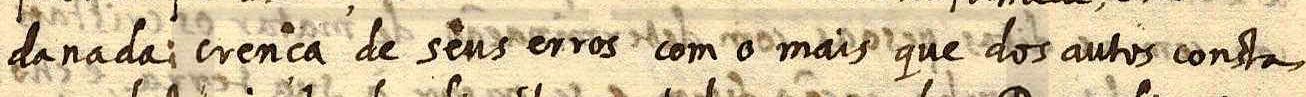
danada crença de seus erros com o mais que dos autos consta
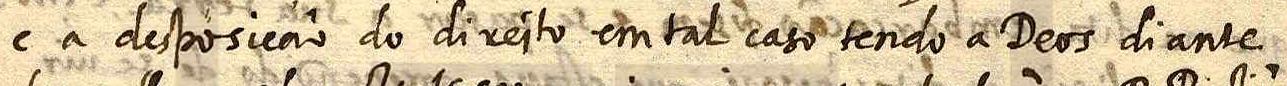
e a desposicaõ do direjto em tal caso tendo a Deos diante
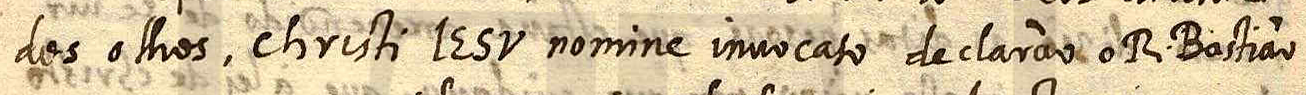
dos olhos, christi IESV nomine inuocato declarão o R. Bastião
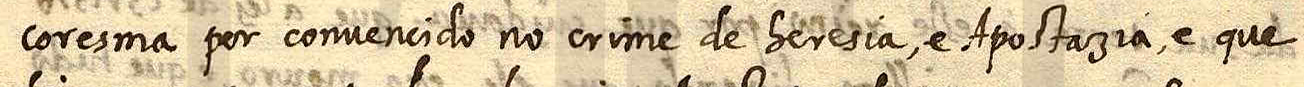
coresma por conuencido no crime de heresia, e Apostazia, e que
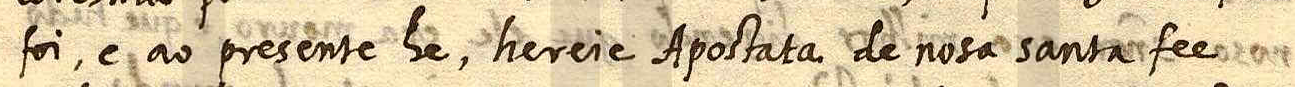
foi, e ao presente he, hereie Apostata de nosa santa fee
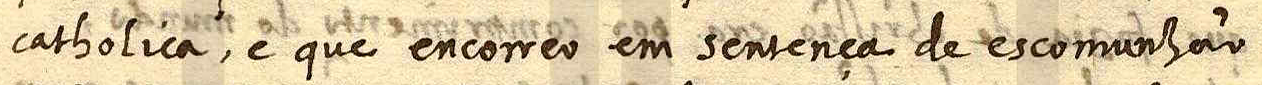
catholica, e que encorreo em sentença de escomunhaõ
